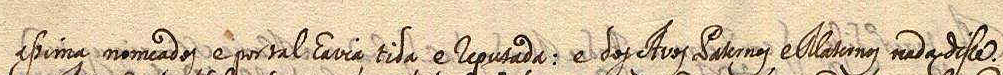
assima nomeados, e por tal havia, tida, e Reputada: e dos Avos Paternos, e Maternos nada disse.
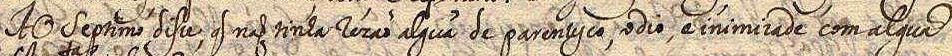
AO Septimo disse, q̄ naõ tinha Rezaõ alguā de parentesco, odio, e inimizade com alguā
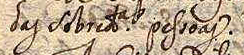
das sobred̄.as pessoas.
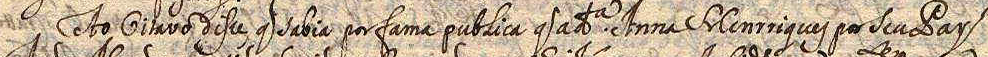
Ao Oitavo disse q̄ sabia por fama publica q̄ a d̄.a Anna Henrriques por seu Pay
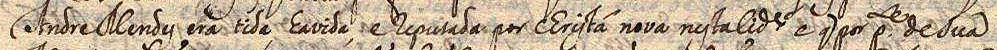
Andre Mendes era tida, havida, e Reputada por Christã nova nesta Cid.e e q̄ por p.te de Sua
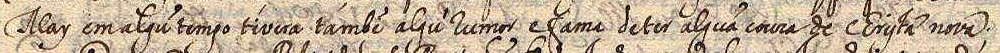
May em algū tempo tivera tambē algū Rumor e fama de ter alguā couza de christã nova;
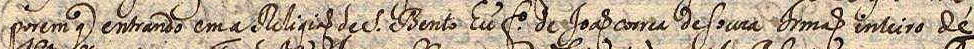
porem q̄ entrando em a Religiaõ de S. Bento hū f.o de Joaõ correa de souza Irmaõ inteiro de
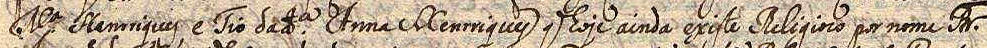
M.a Henrriques, e Tio da d̄.a Anna Henrriques q̄ hoje ainda existe Religiozo por nome Fr.
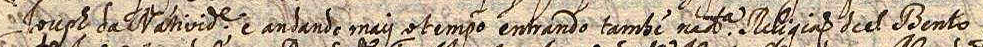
Jozeph da Nativid.e, e andando mais o tempo entrando tambē na d̄.a Religiaõ de S. Bento
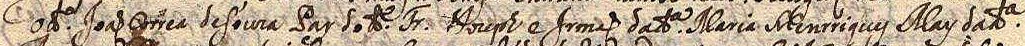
o d̄.o Joaõ Correa de souza Pay do d̄.o Fr. Iozeph e Jrmaõ da d̄a Maria Henrriques May da d̄a.
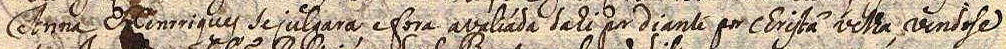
Anna Henrriques se julgara, e fora avaliada dahi por diante por christã velha, vendose
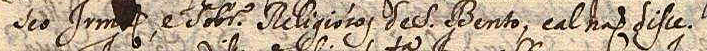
seo Jrm_, e Sobr.o Religiozos de S. Bento, e al naõ disse.
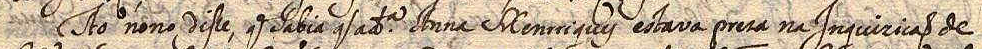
Ao nono disse, q̄ Sabia q̄ a d̄.a Anna Henrriques estava preza na Jnquiziçaõ de
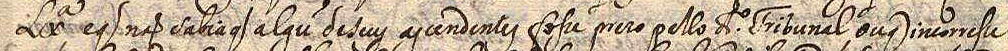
Lxa, e q̄ naõ sabia q̄ algū de seus ascendentes fosse prezo pello d̄.o Tribunal, ou q̄ incorresse
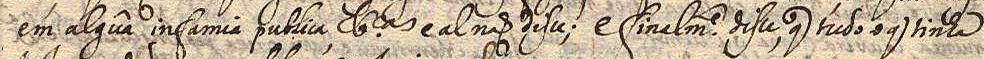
em alguā infamia publica, &.ca e al naõ disse; e finalm.te disse, q̄ tudo o q̄ tinha
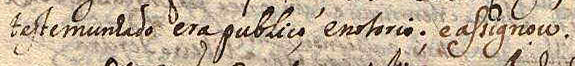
testemunhado era publico, e notorio; e assignou.
